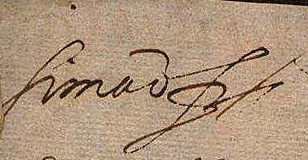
simão frz̄
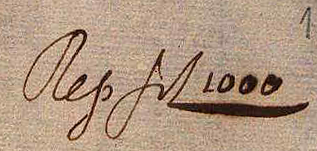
Rep foL 1000
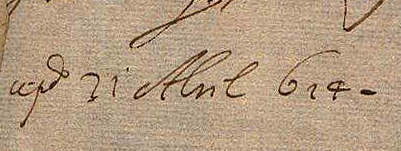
21 Abril 614 -
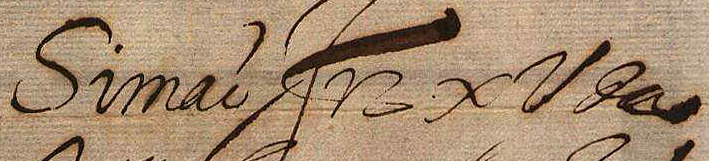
Simão frz̄ x V de
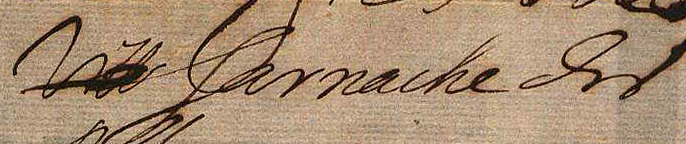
Vill Sarnache dos
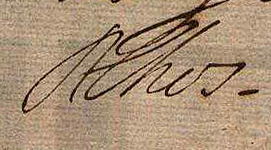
Alhos
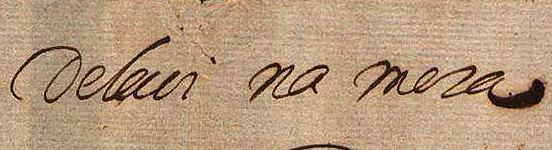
De leui na meza
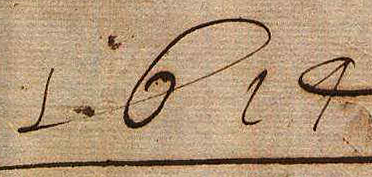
1614
